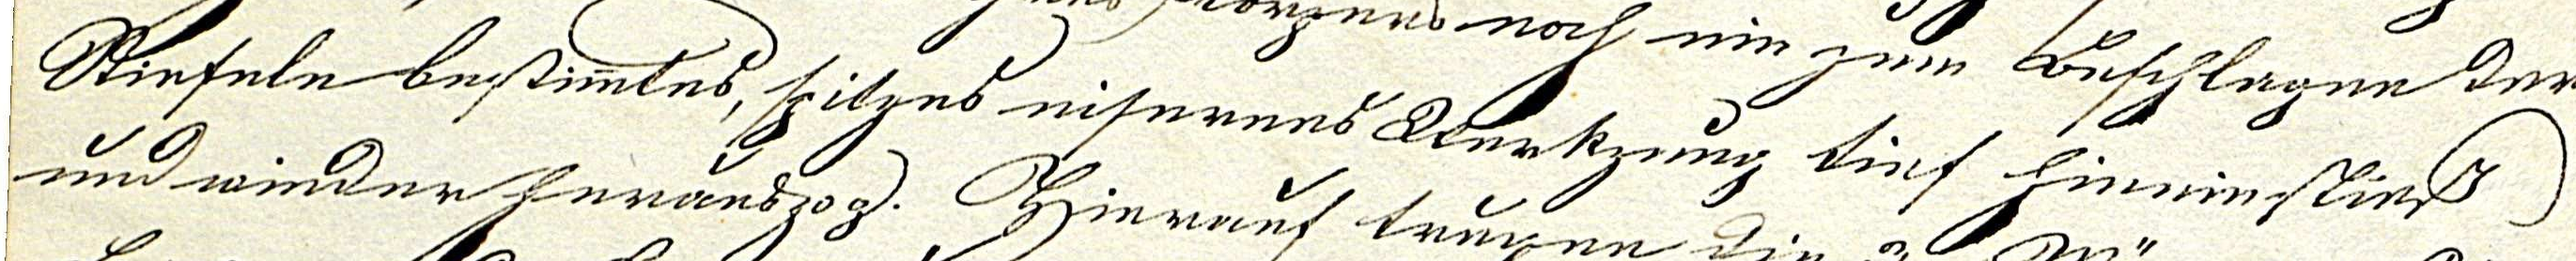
Stiefele bestimmtes, spitzes eisernes Werkzeug tief hinein stieß
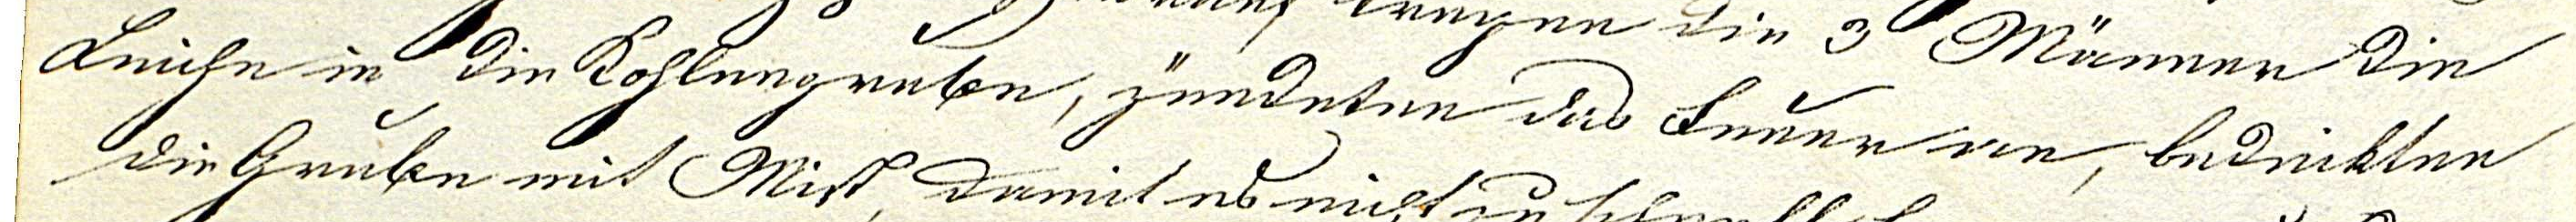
und wieder herauszog. Hierauf trugen die 3 Männer die
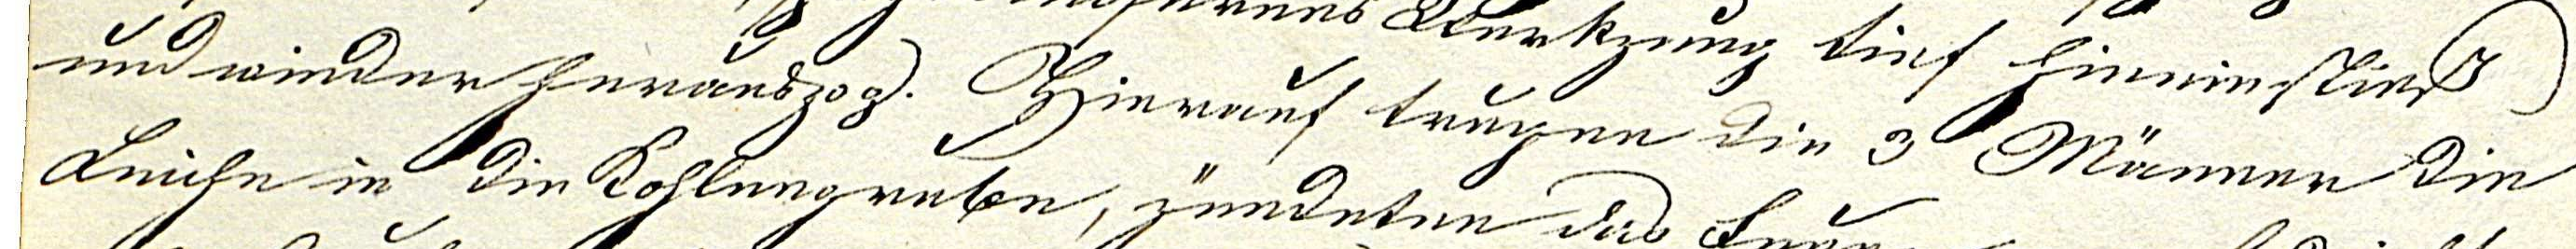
Leiche in die Kohlengrube, zündeten das Feuer an, bedinkten
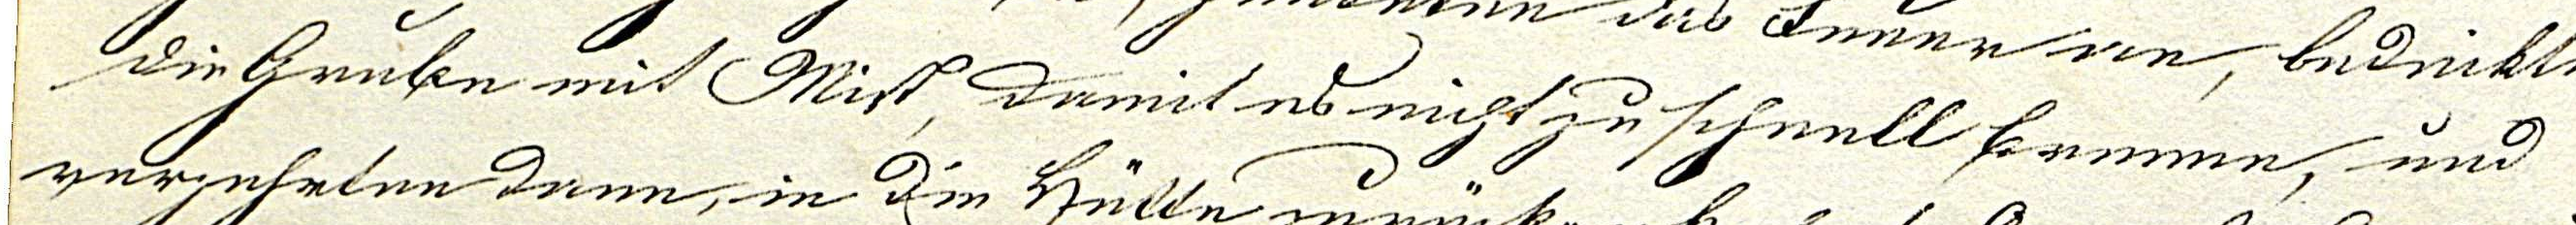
die Grube mit Mist, damit es nicht zu schnell brenne, und
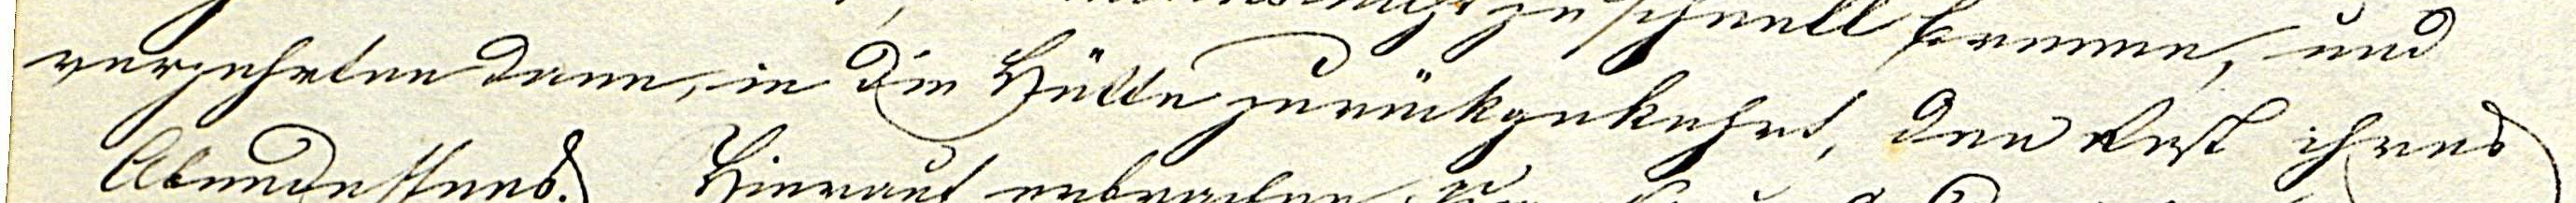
verzehrten dann, in die Hütte zurückgekehrt, den Rast ihres
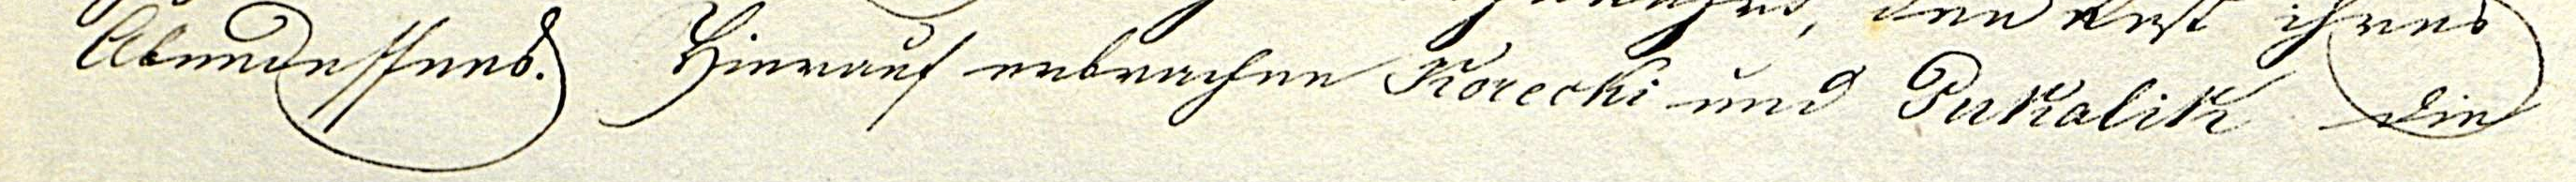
Abendessens. Hierauf erbrachen Korecki und Pukalik die
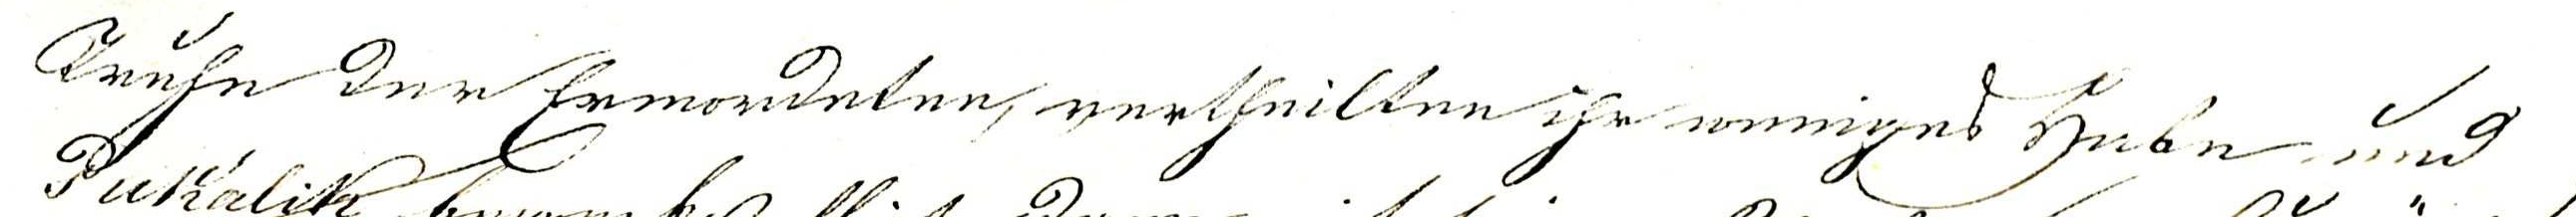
Truhe der Ermordeten, vertheilten ihr weniges Habe und
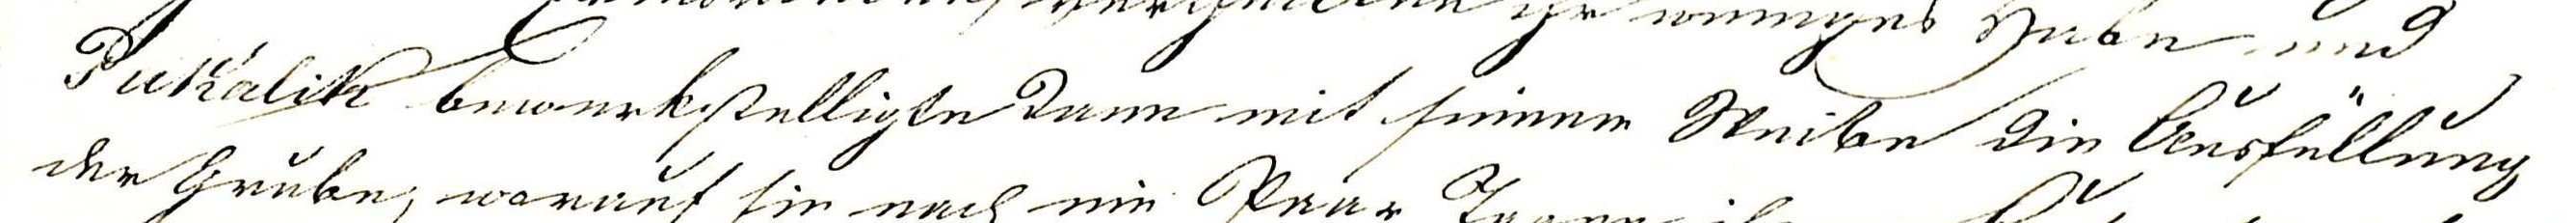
Pukalik bewerkstelligte dann mit seinem Weibe die Ausfällung
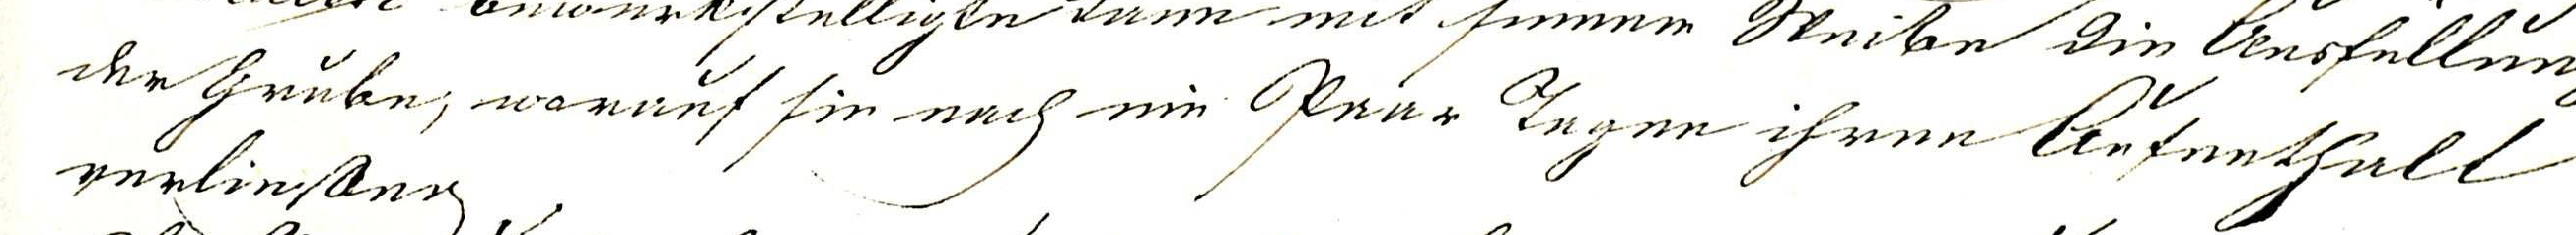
der Grube, worauf sie nach nie Paar Tagen ihren Aufenthalt
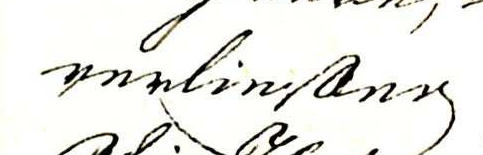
verließen
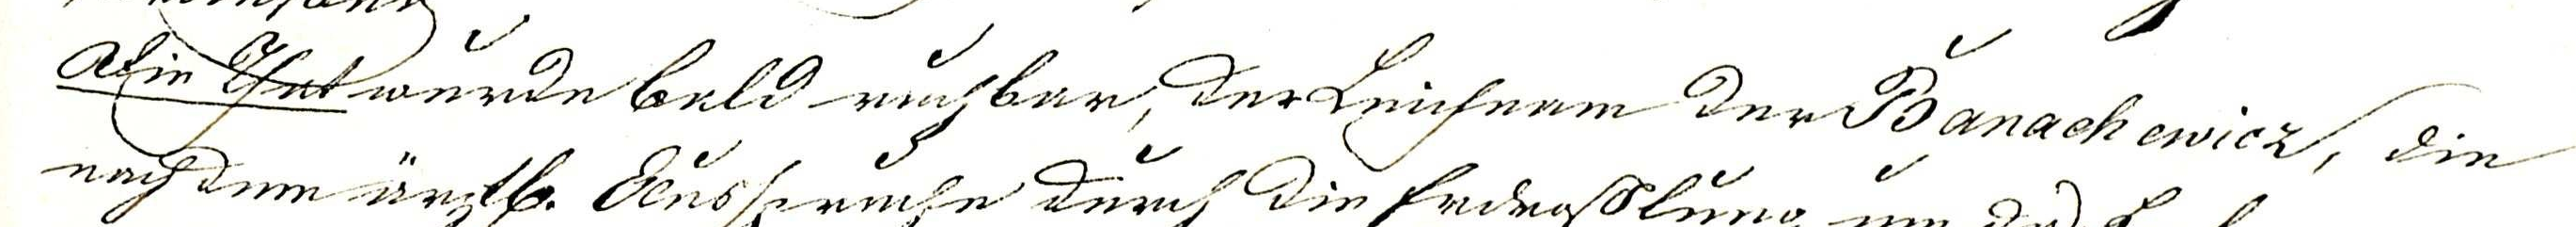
Die That wurde bald ruchbar, der Leichnam der Banachewicz, die
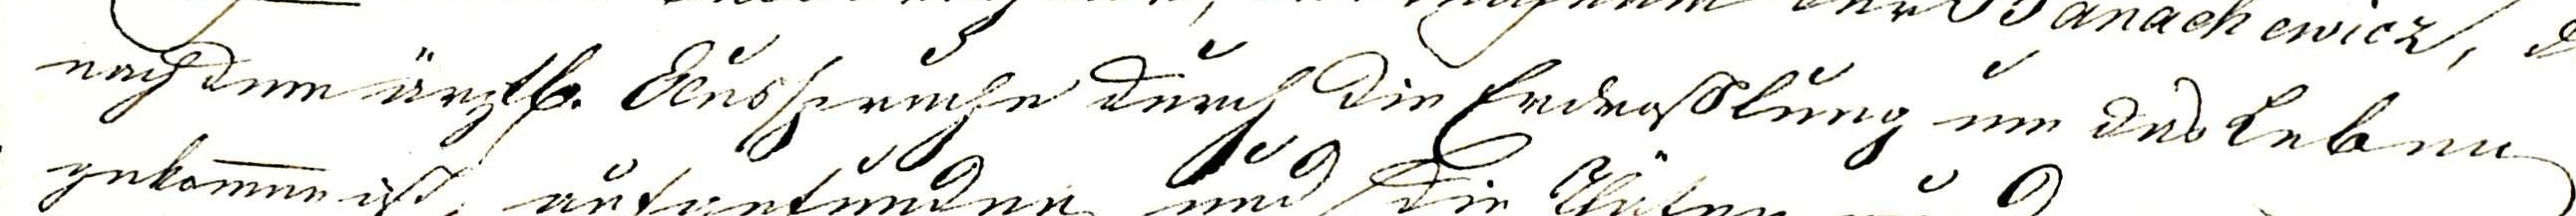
nach dem ärztb. Ausspruche durch die Erdroßlung um das Lebe
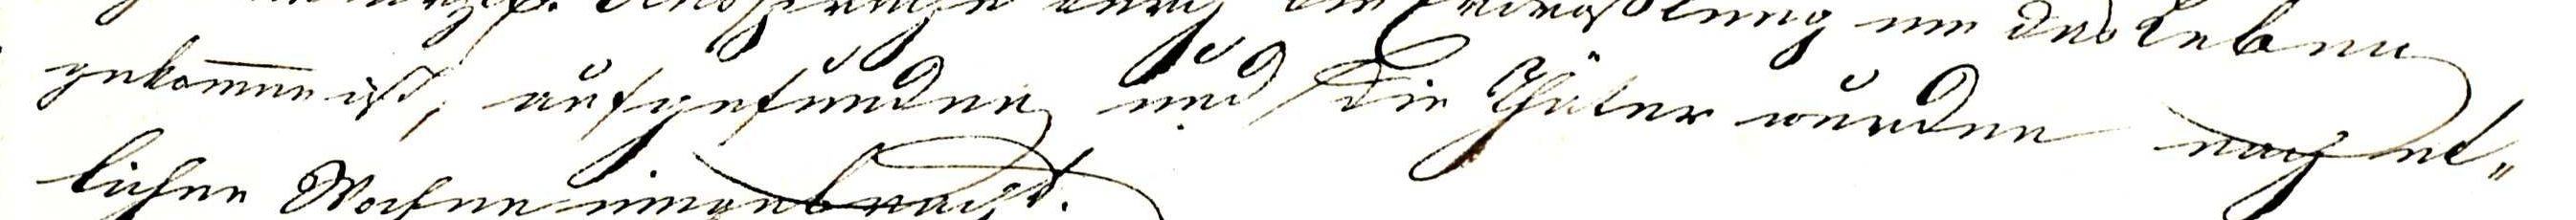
gekommen ist, aufgefunden und die Thäter wurden nach et¬
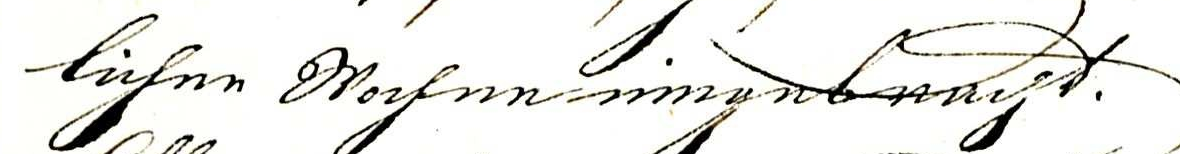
lichen Wochen eingebracht.
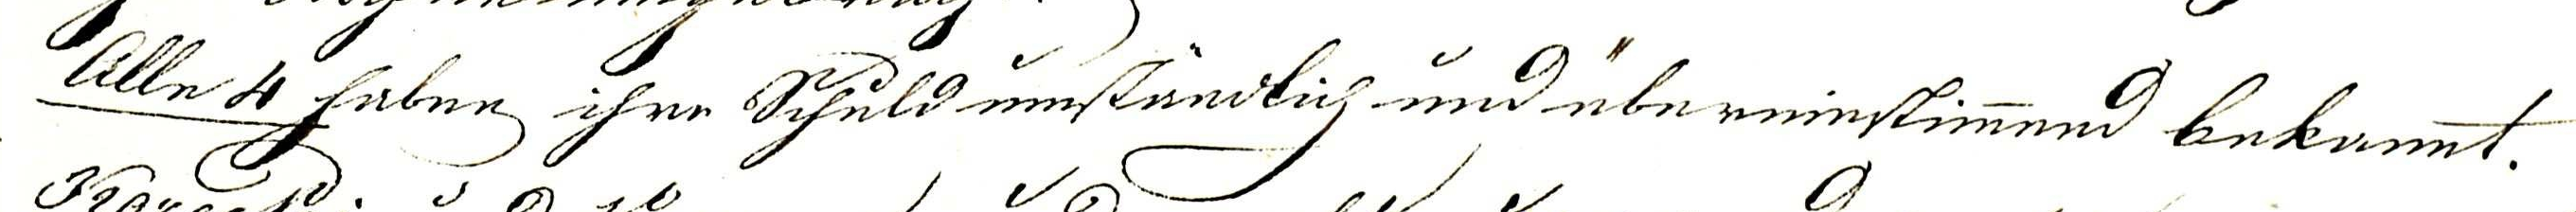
Alle 4 haben ihre Schuld umständlich und übereinstimmend bekannt.
